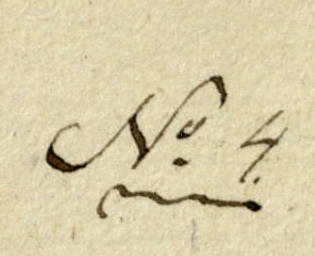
No 4.
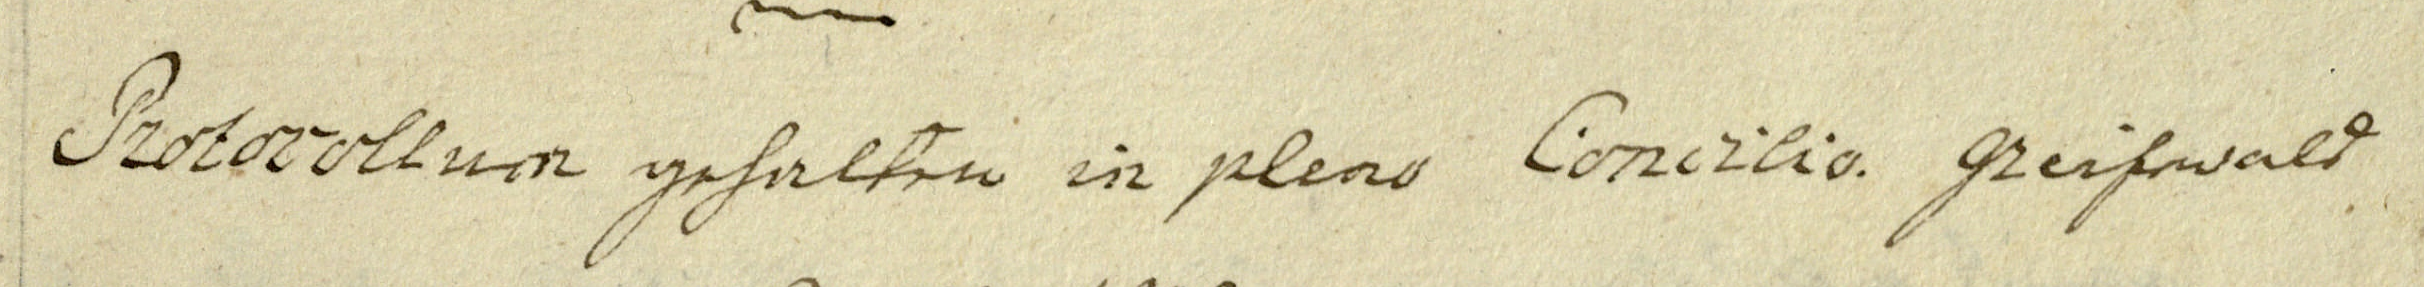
Protocollum gehalten in pleno Concilio Greifswald
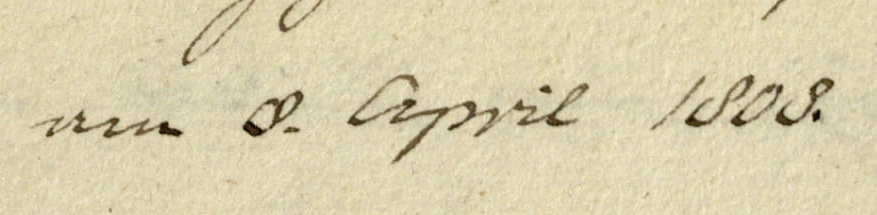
am 8. April 1808.
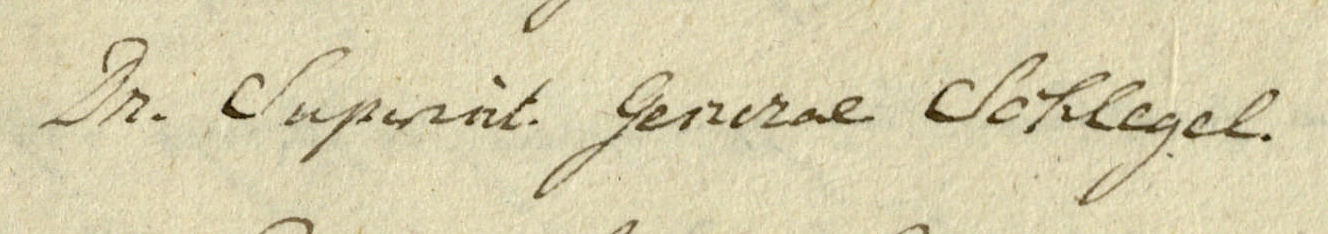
Dn. Superint. General Schlegel.
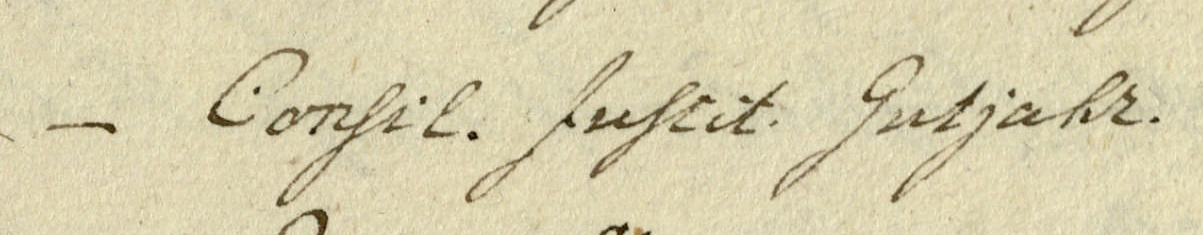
Consil. Justit. Gutjahr.
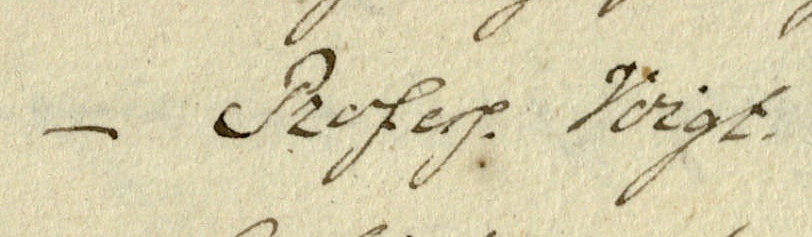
Prof. Voigt.
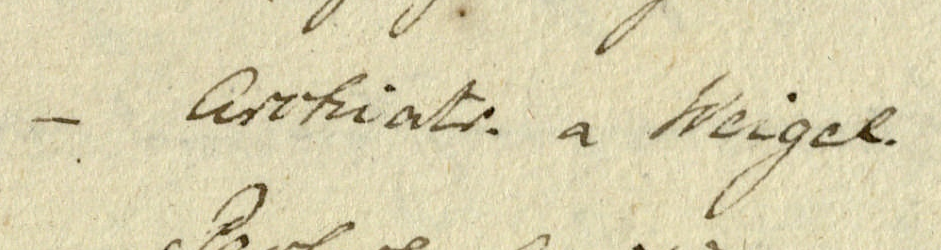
Archiatr. a Weigel.
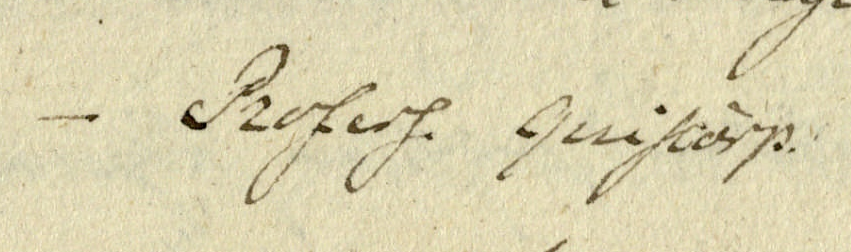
Profess. Quistorp
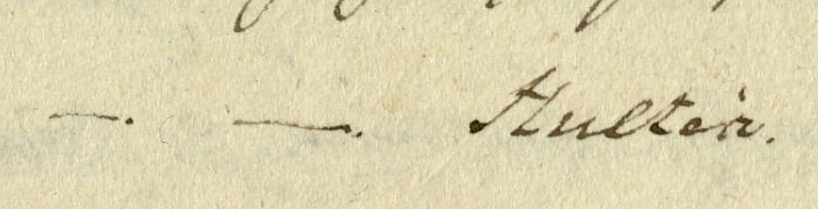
Hultén.
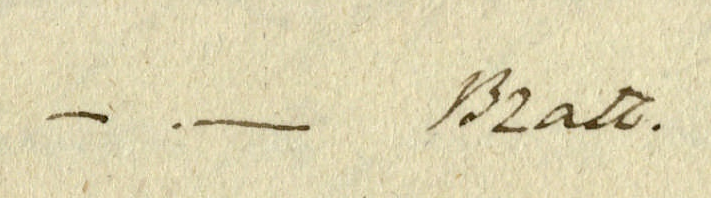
Bratt.
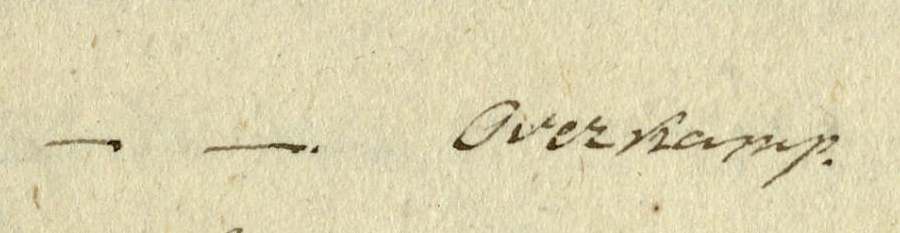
Overkamp.
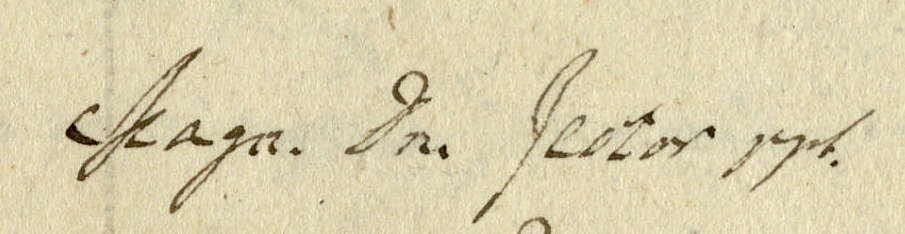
Magn. Dn. Rector ppt.
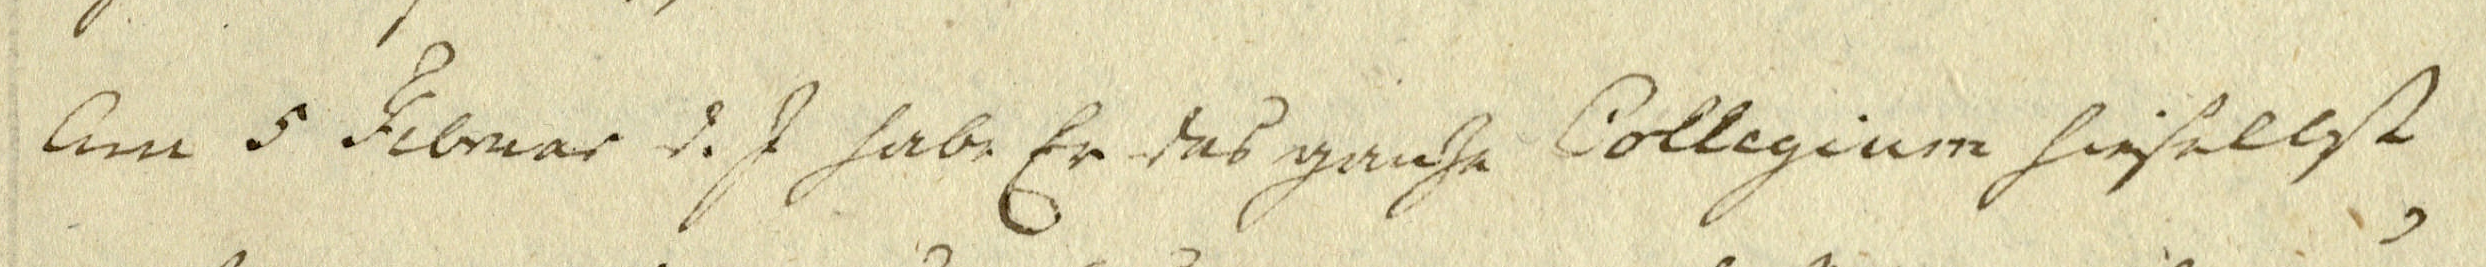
Am 5 Februar d. J. habe Er das ganze Collegium hieselbst
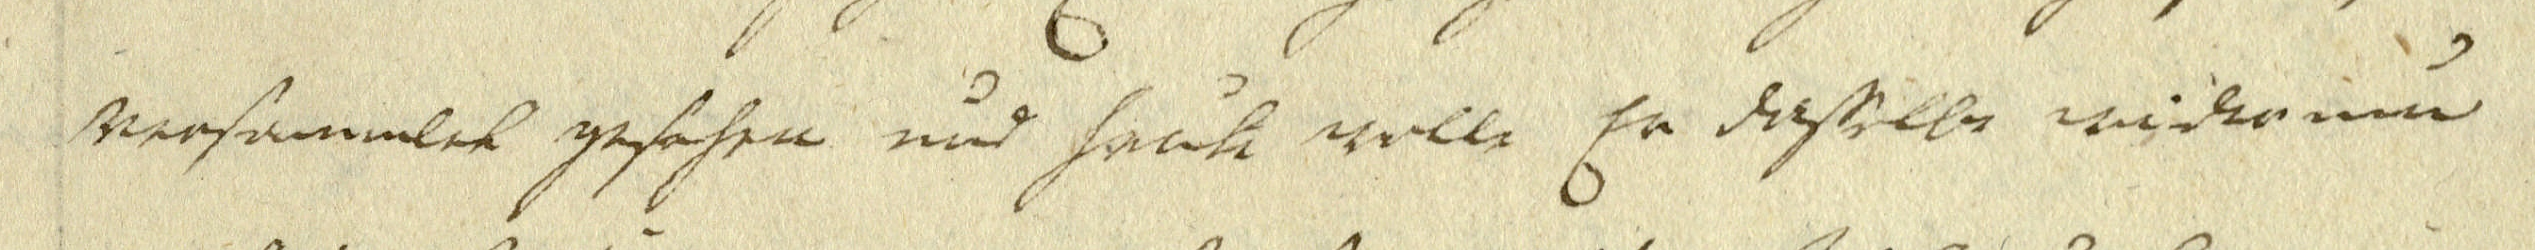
versammlet gesehen und heute wolle Er dasselbe wiederum
